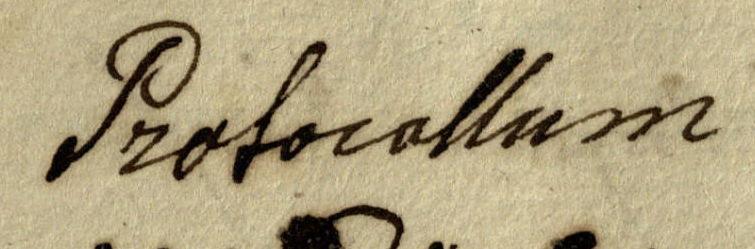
Protocollum
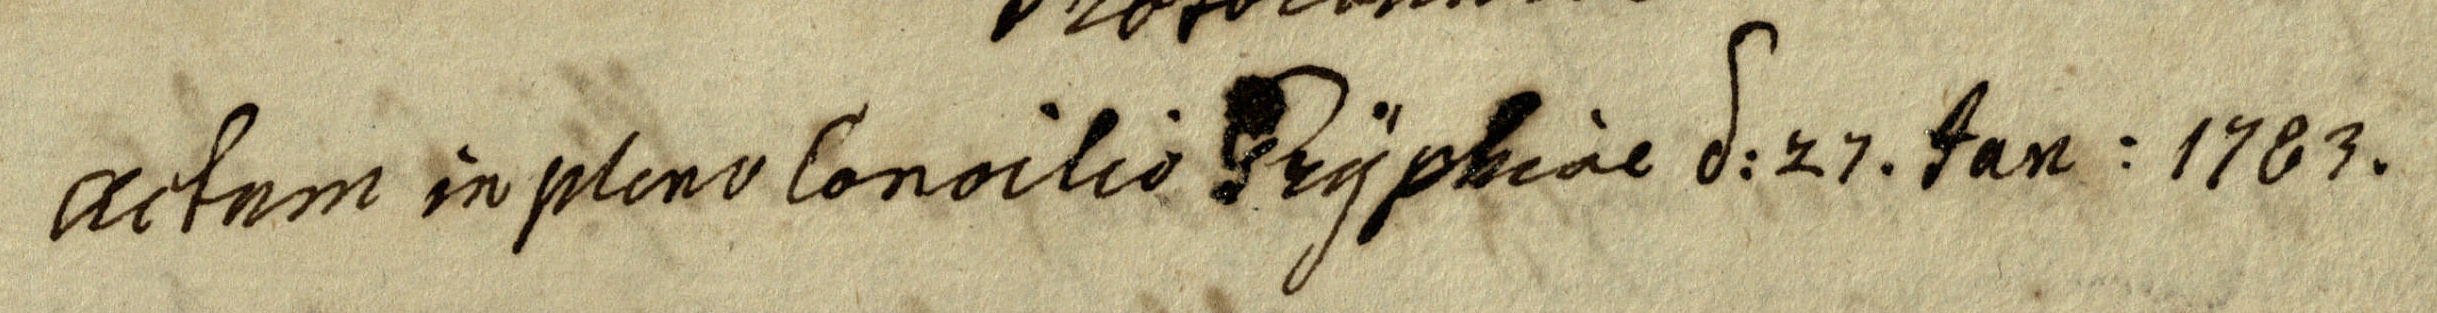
Actum in pleno Concilio Grÿphiae d. 27. Jan. 1783.
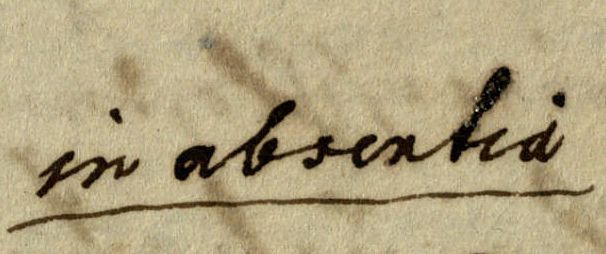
in absentia
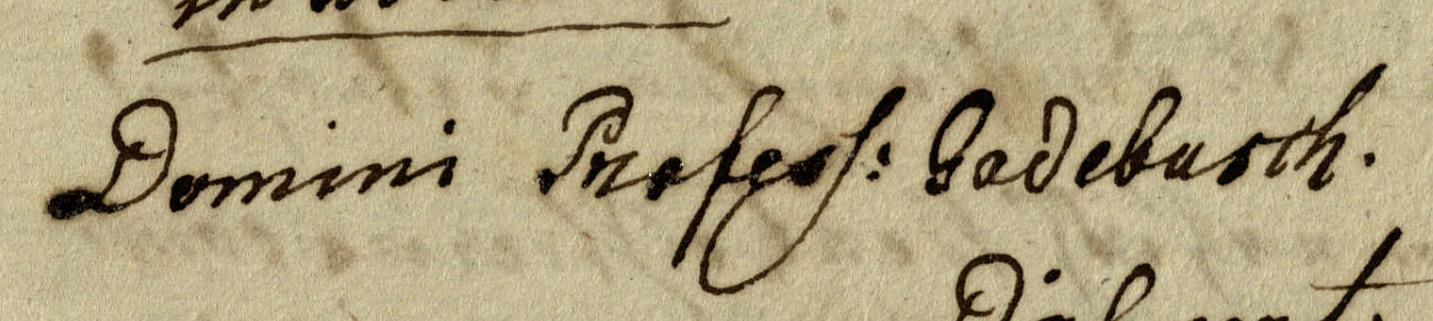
Domini Profess. Gadebusch.
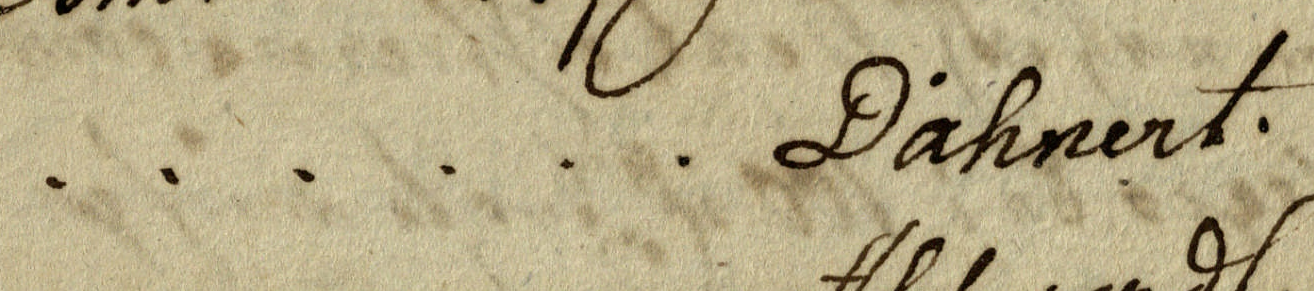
Dähnert.
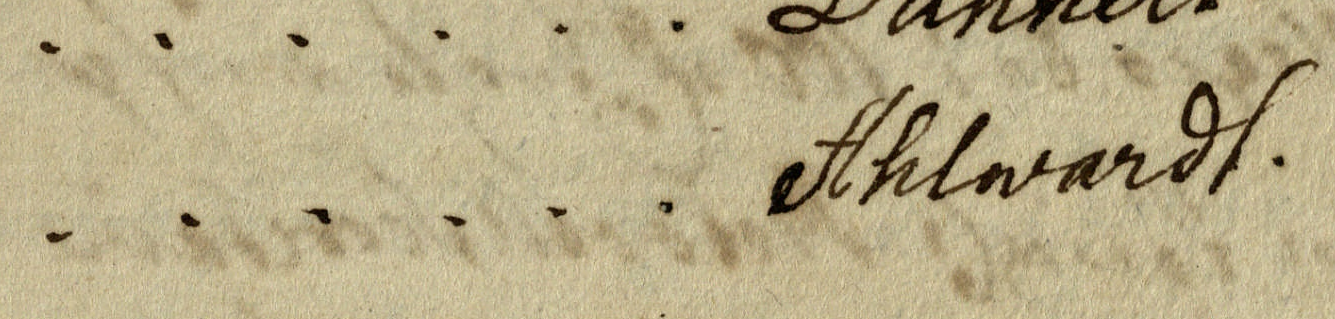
Ahlwardt.
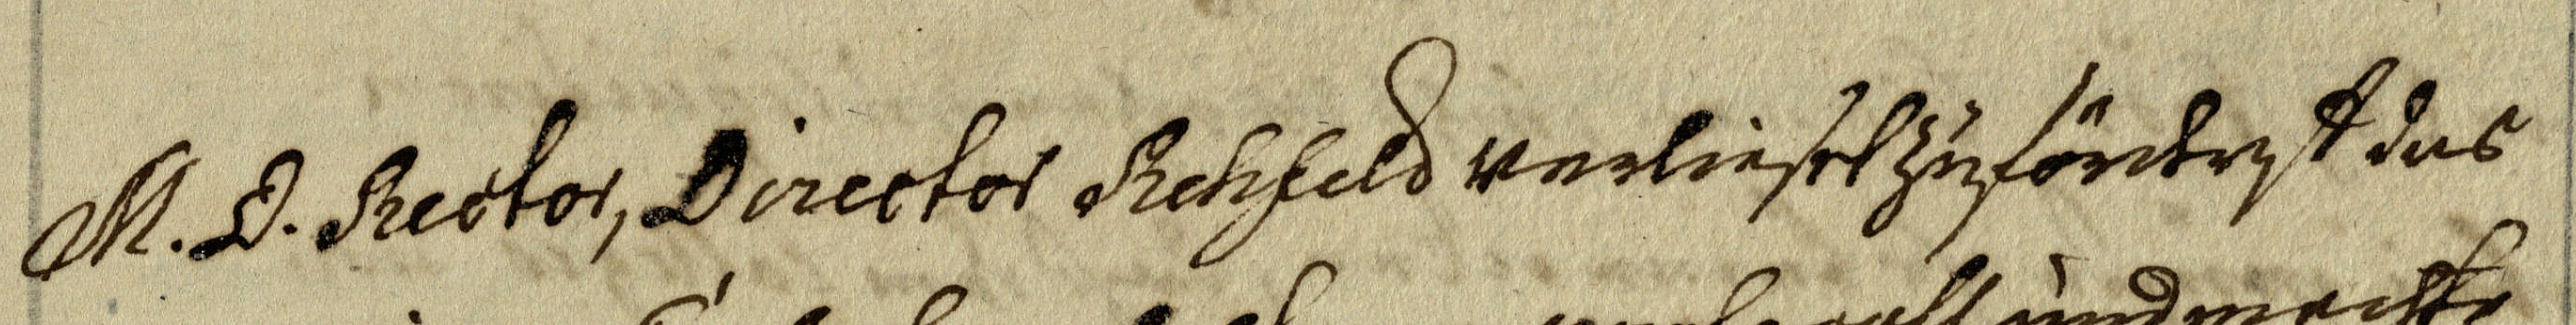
M. D. Rector, Director Rehfeld verlieset zuförderst das
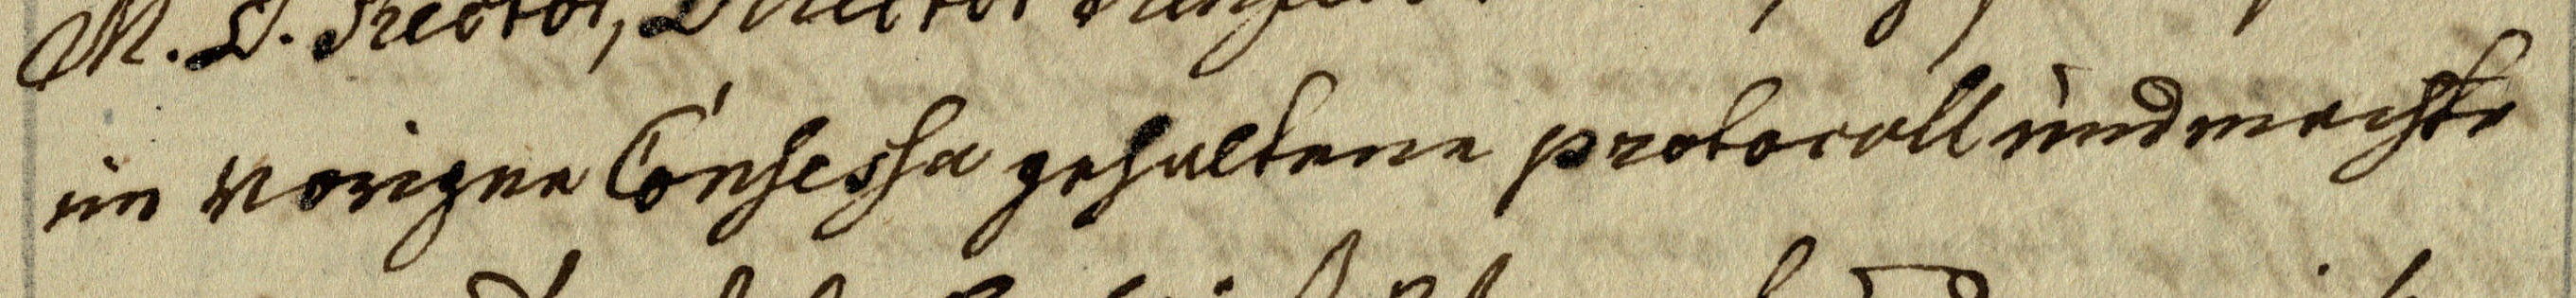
im vorigen Consessu gehaltenen protocoll und machte
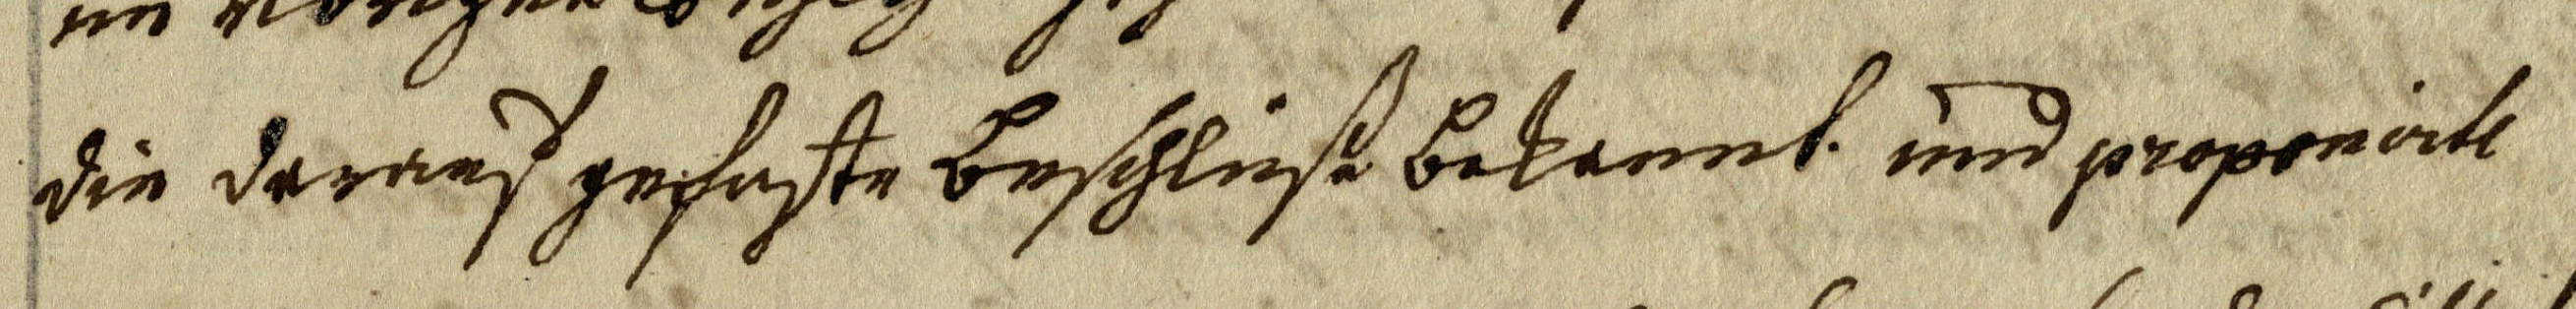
die darauf gefaste Beschlüße bekannt und proponirte
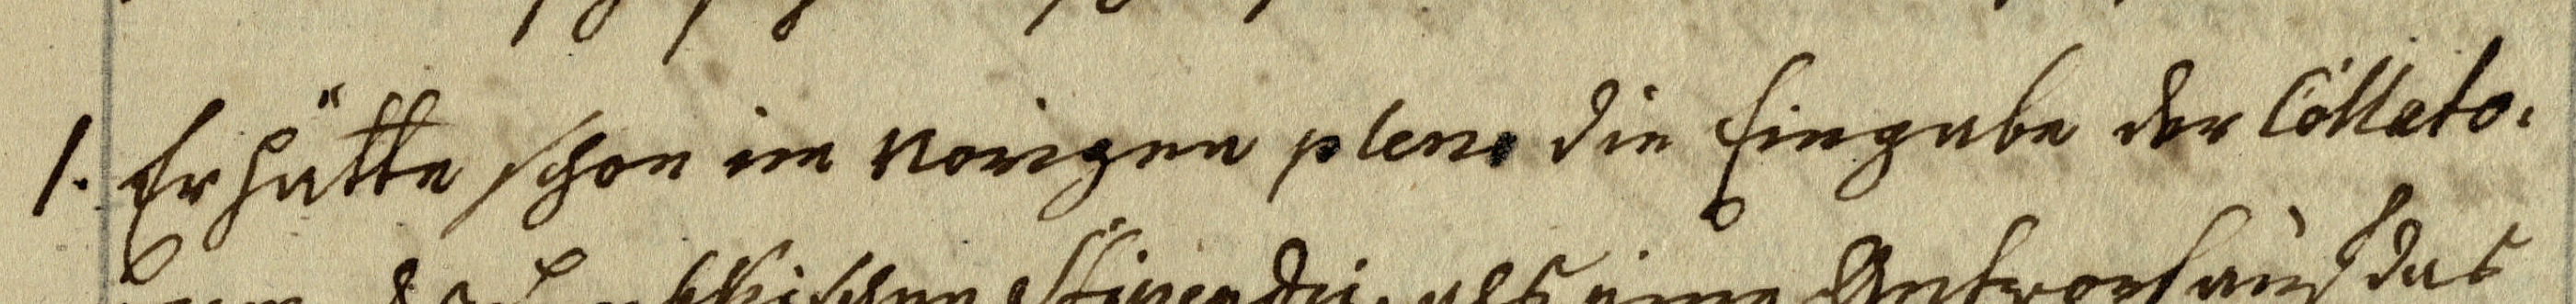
1. Er hätte schon im vorigen pleno die Eingabe der Collato¬
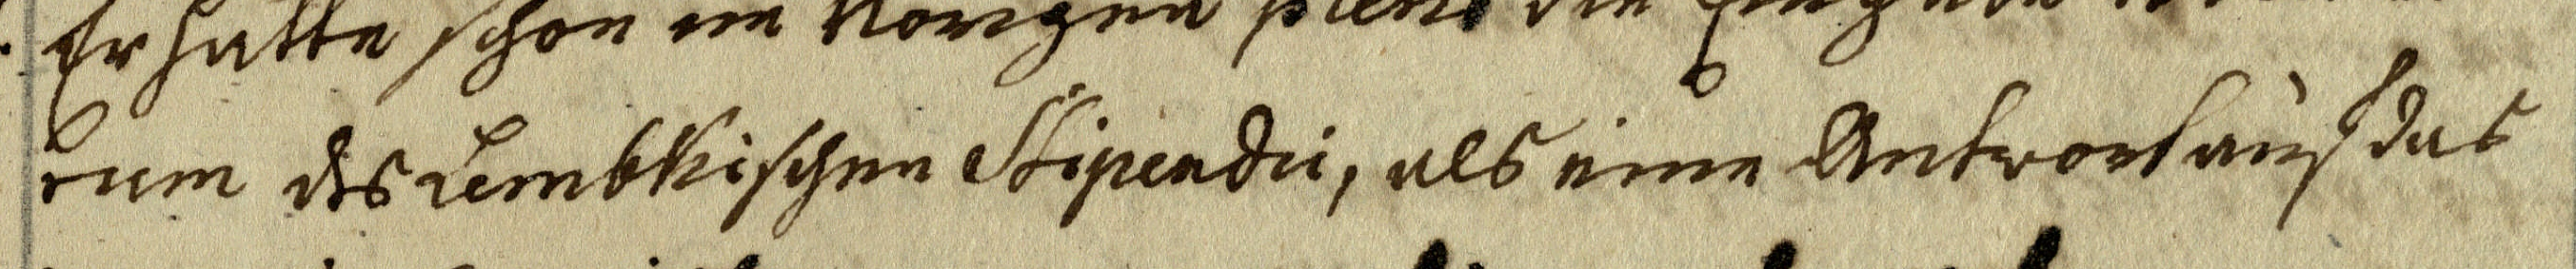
rum des Lembkischen Stipendii, als eine Antwort auf das
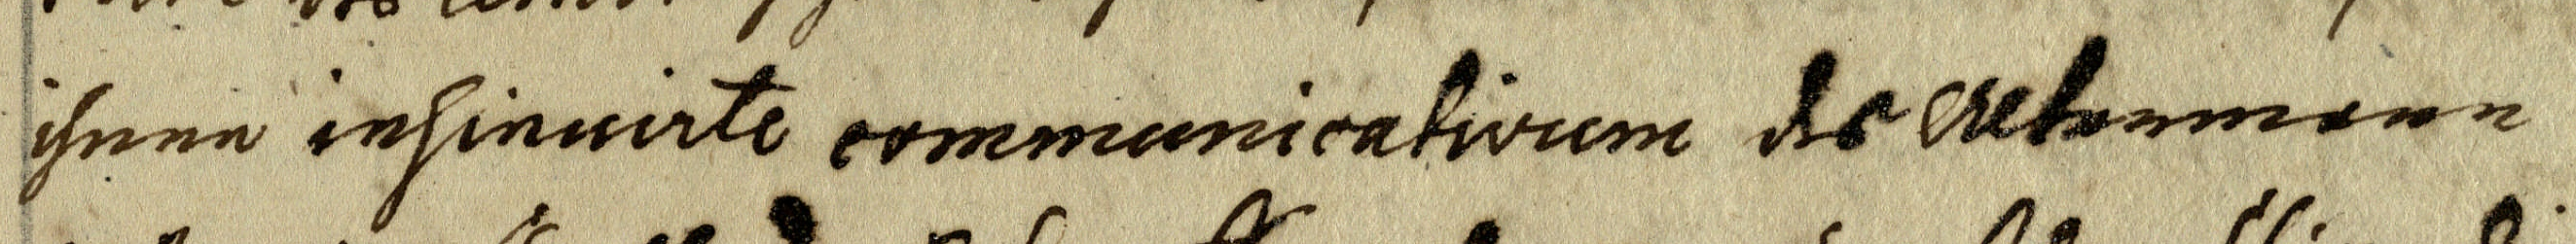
ihnen insinuirte communicativum des Altermann
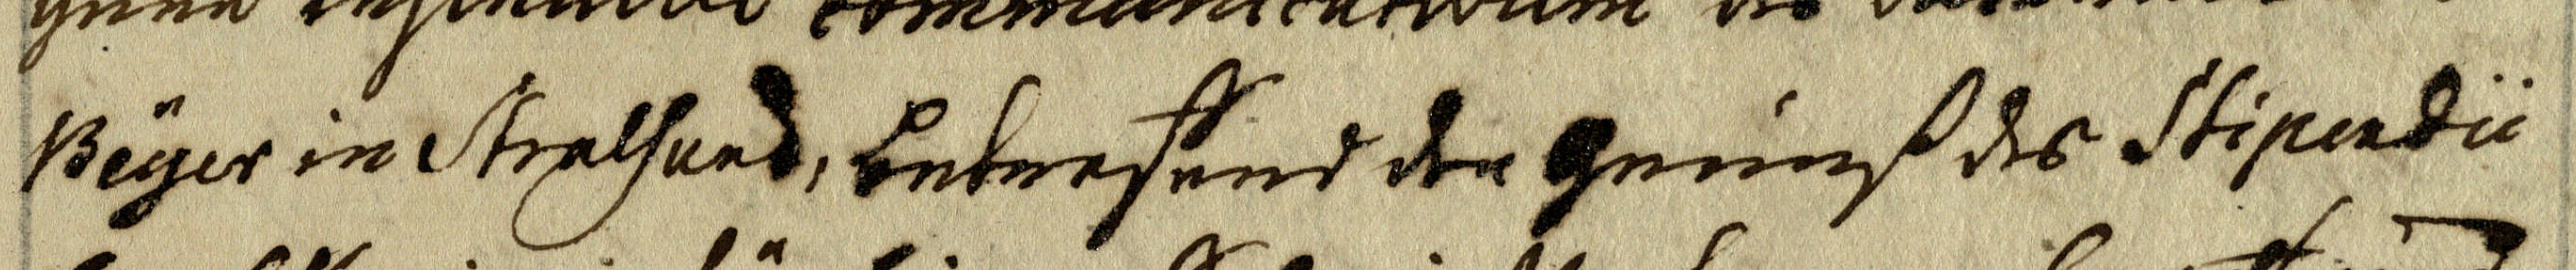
Beÿer in Stralsund, betreffend den Genuß des Stipendii
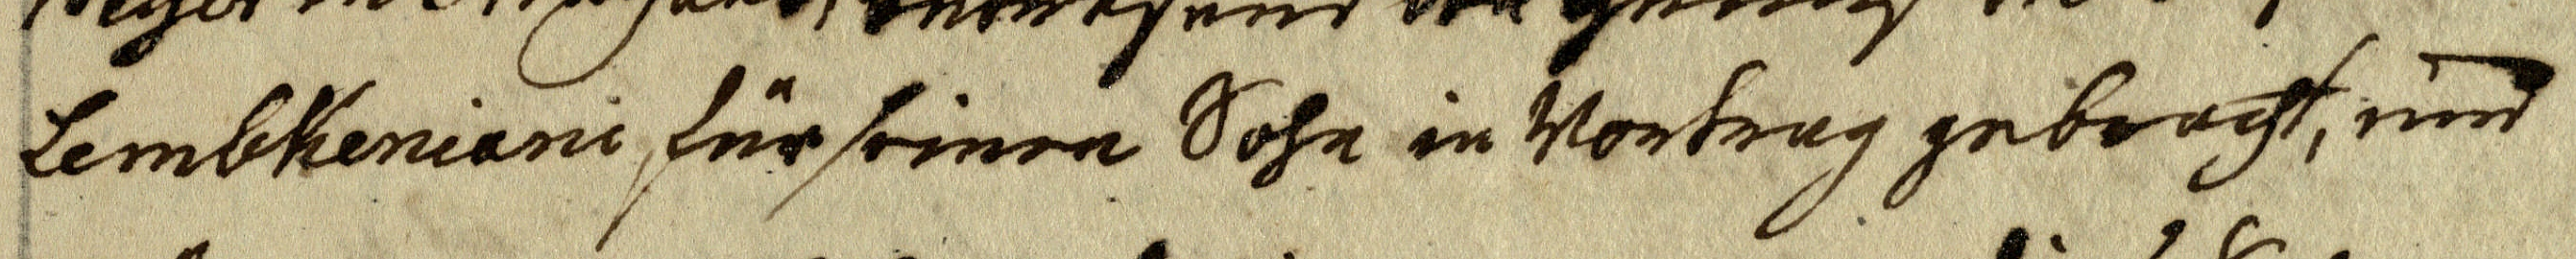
Lembkeniani für seinen Sohn in Vortrag gebracht, und
